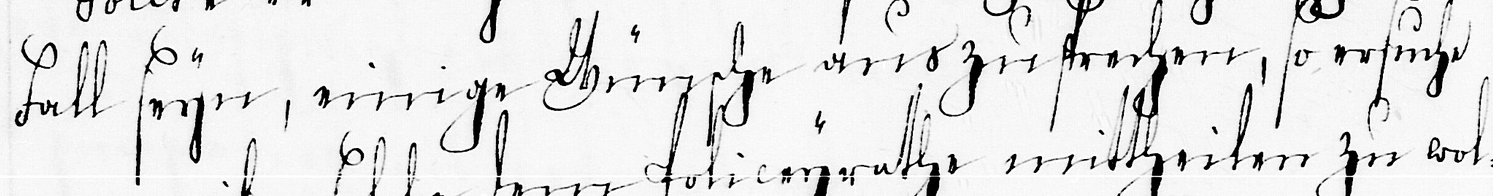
Fall seyn, einige Wünsche auszusprechen, so ersuche
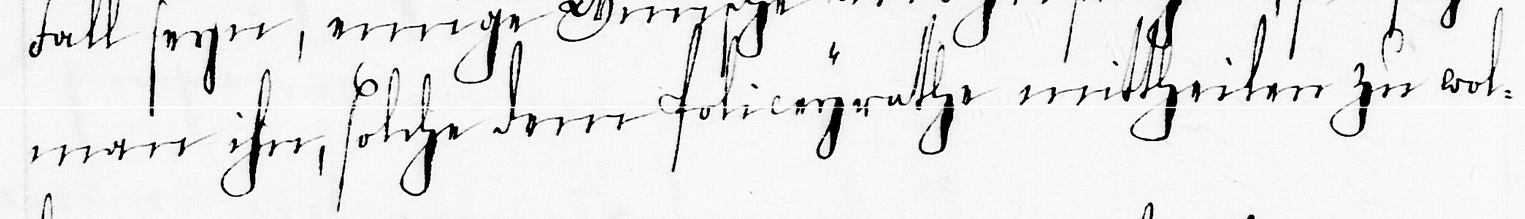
man ihn, solche dem Policeyrathe mittheilen zu wol¬
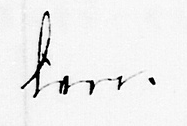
len.
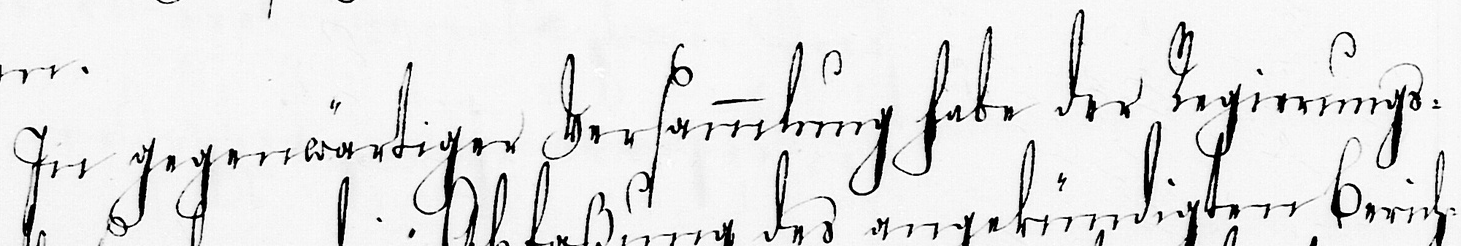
In gegenwärtiger Versammlung habe der Regierungs¬
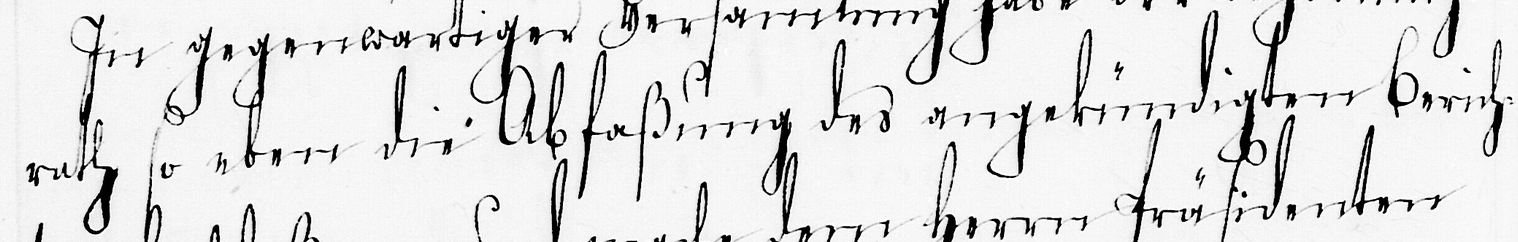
rath so eben die Abfaßung des angekündigten Beric¬
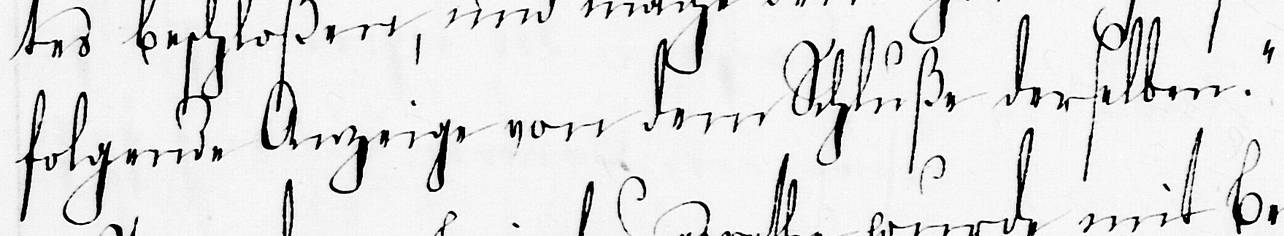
folgende Anzeige von dem Schluße derselben.“
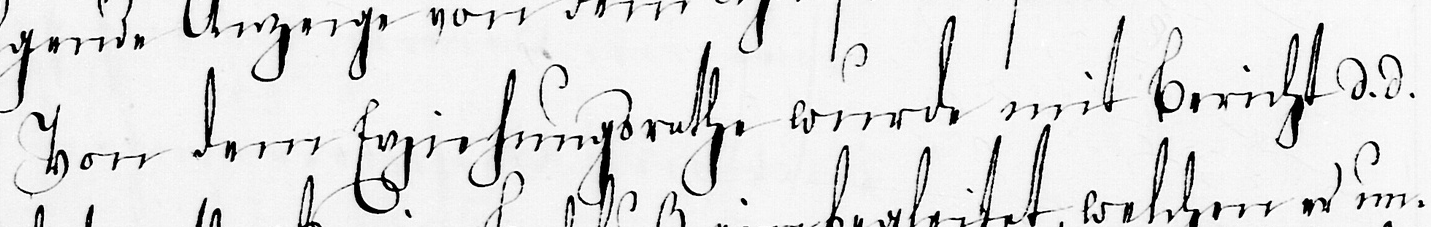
Von dem Erziehungsrathe wurde mit Bericht d.
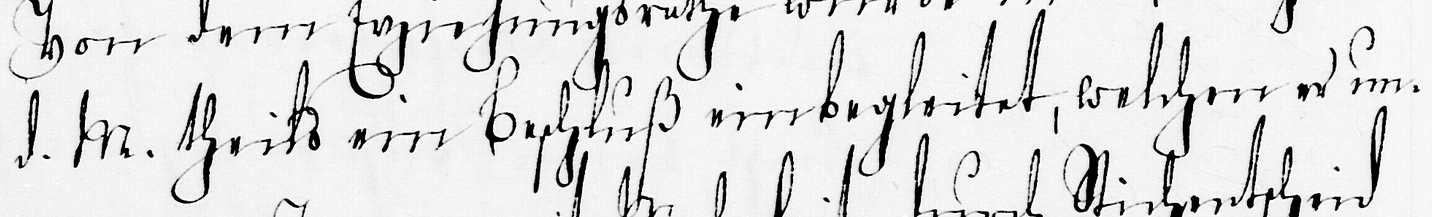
d. M. theils ein Beschluß einbegleitet, welchen er un¬
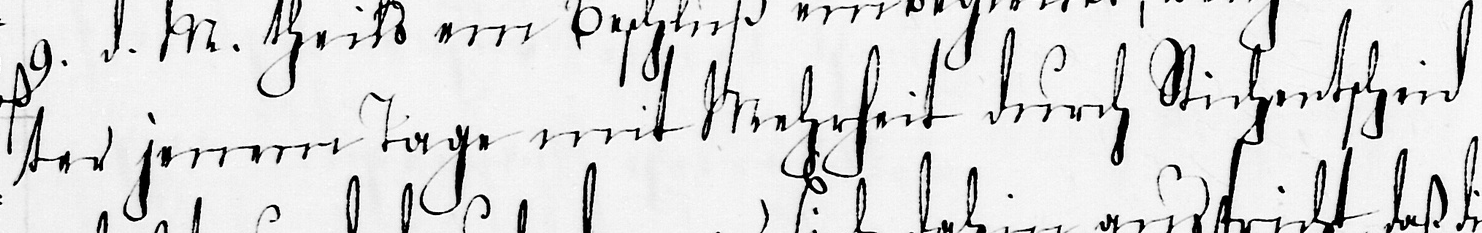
ter jenem Tage mit Mehrheit durch Stichentscheid
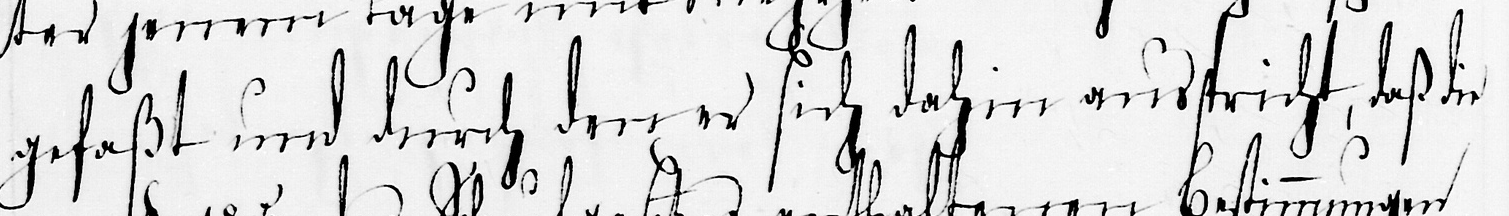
gefaßt und durch den er sich dahin ausspricht, daß
